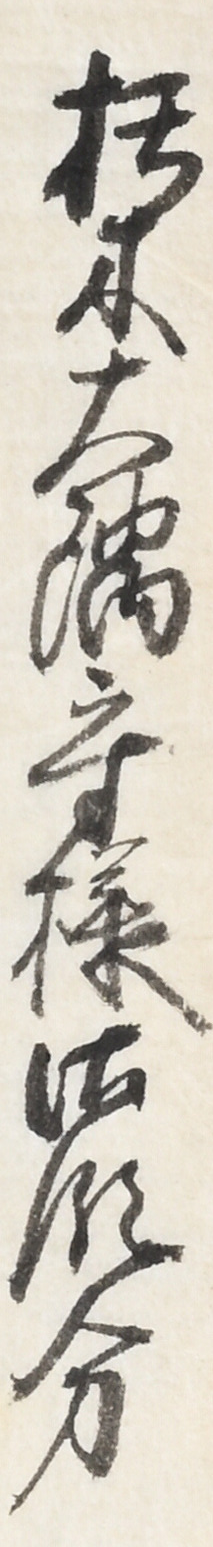朽木大隅守様御領分
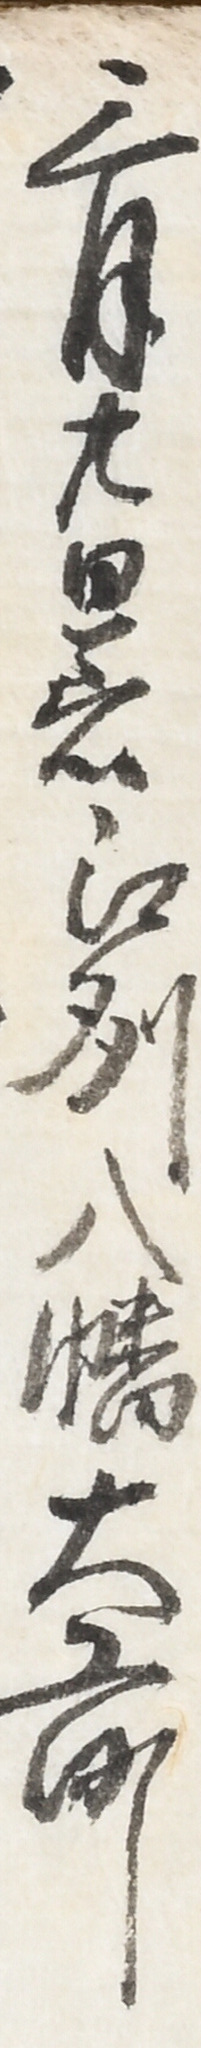三月廿日着江州八幡大工町
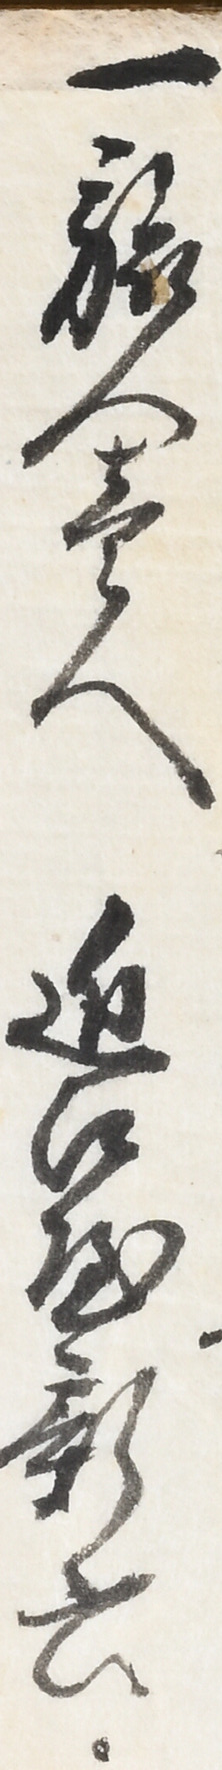一旅人壱人近江屋新六・
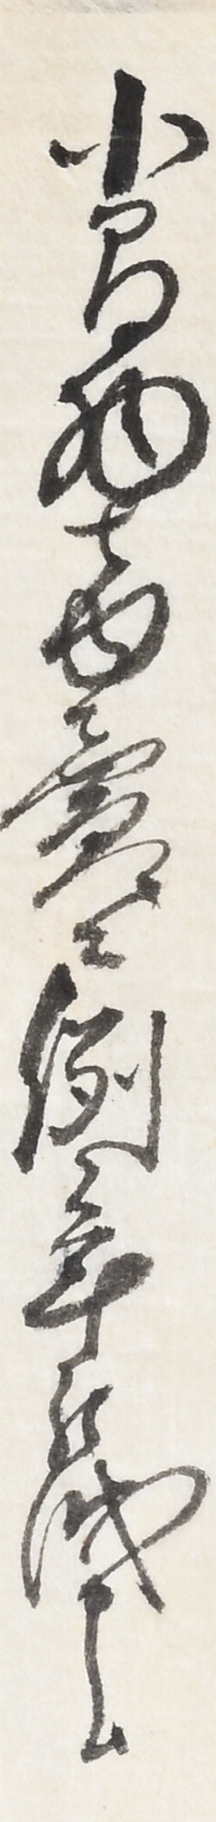小間物商売ニ而例年罷越申候
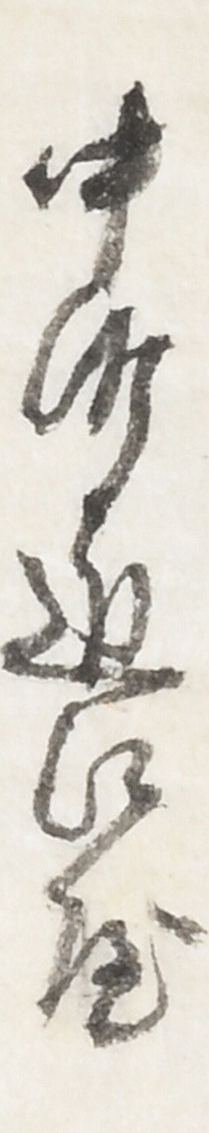中町近江屋
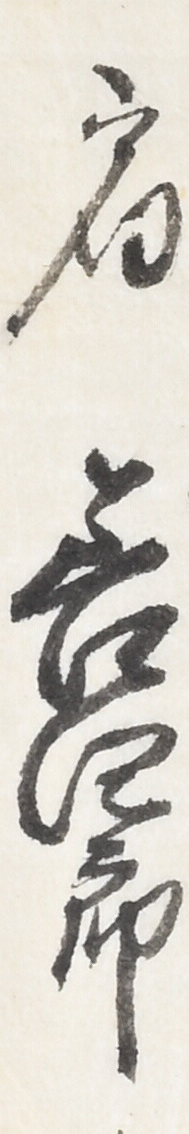宿善四郎
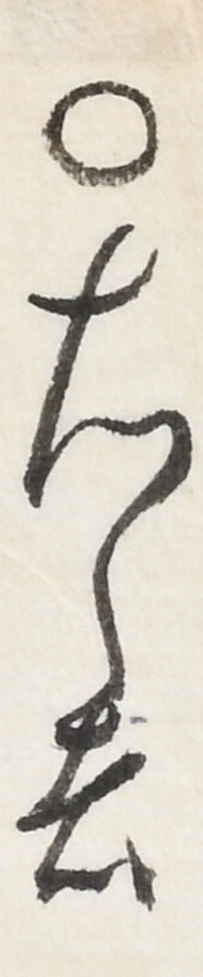〇右之者
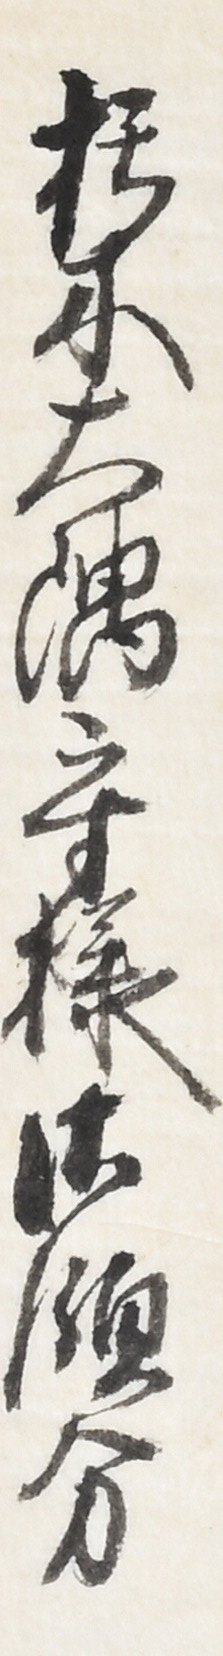朽木大隅守様御領分
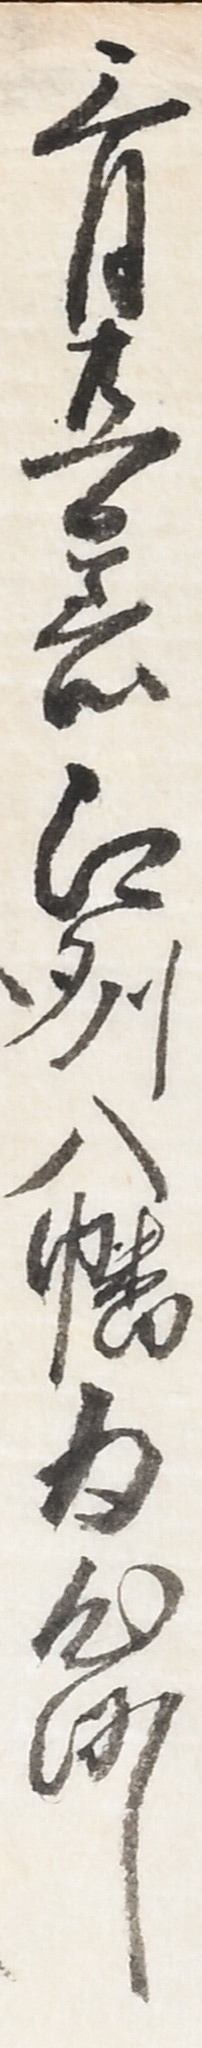三月廿一日着江州八幡為心町
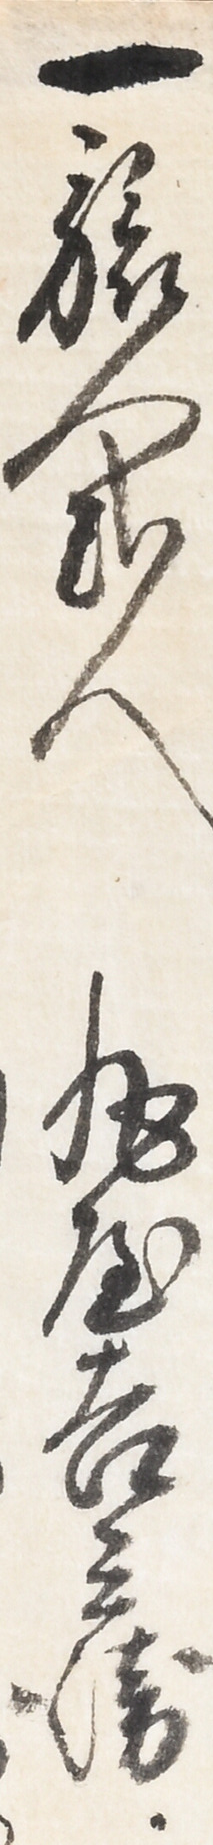一旅人弐人丸屋吉兵衛・
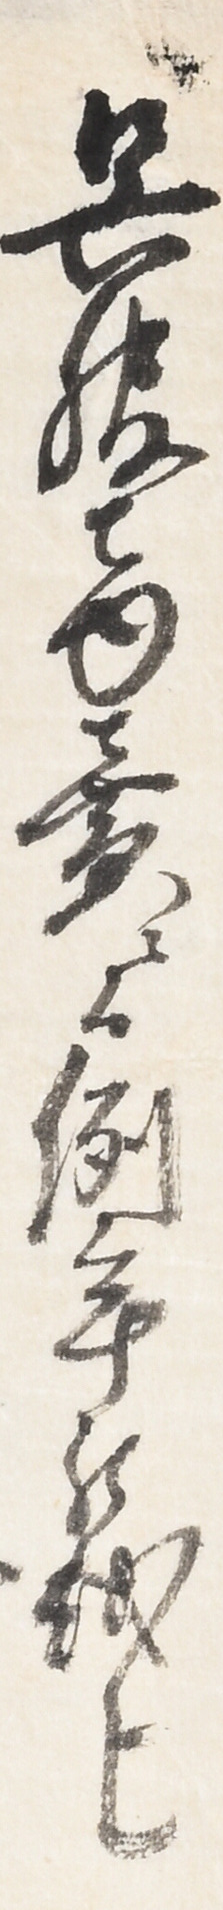呉服商売ニ而例年罷越申候
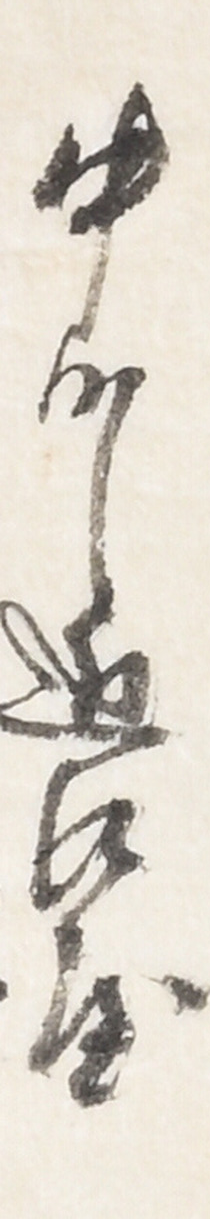中町近江屋
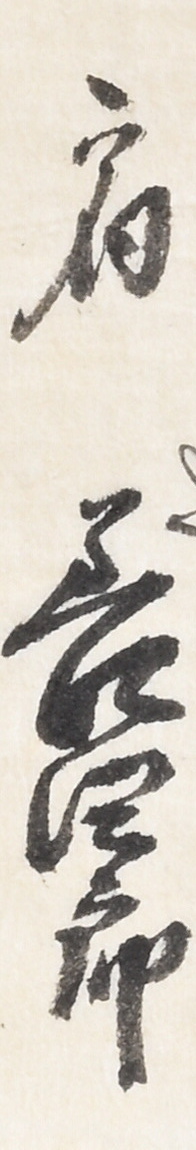宿善四郎
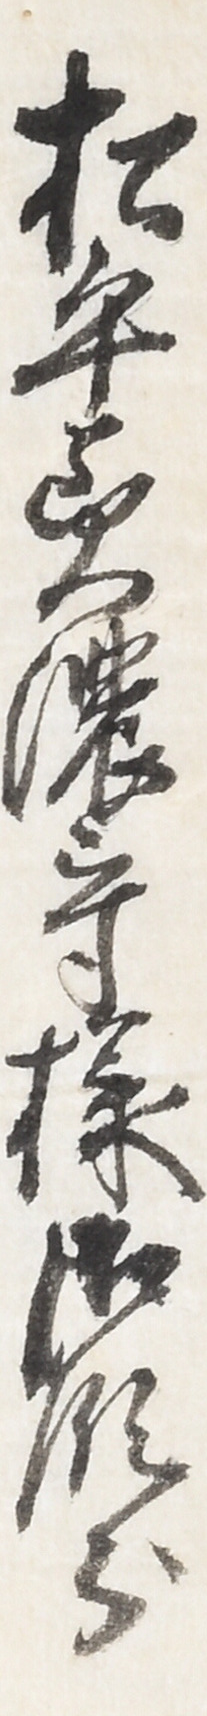松平美濃守様御領分
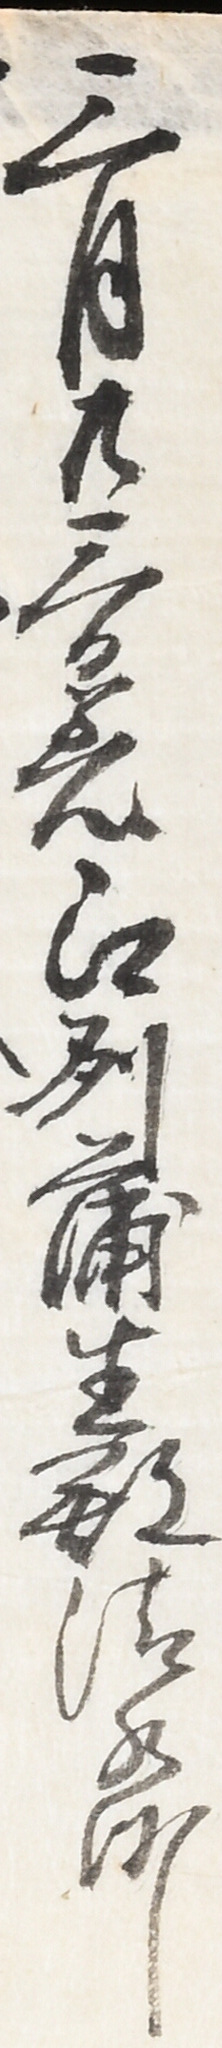参月廿三日着江州蒲生郡清水町
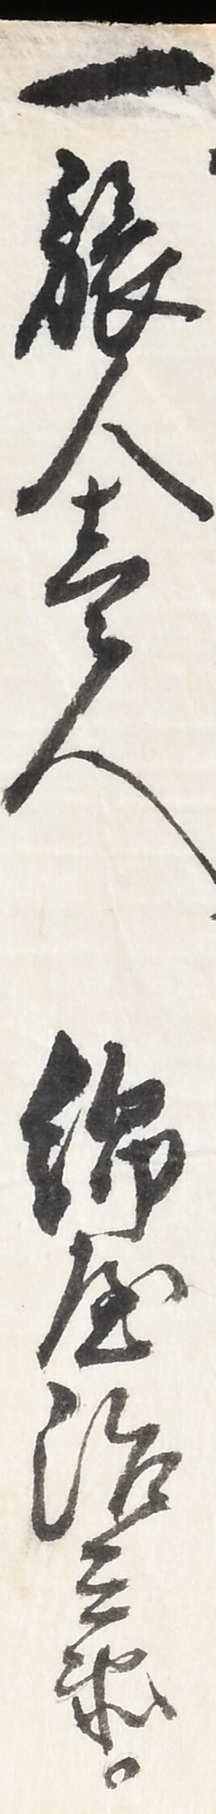一旅人壱人綿屋治兵衛。
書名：旅人泊控帳
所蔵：伊那市立高遠町図書館・合同会社AMANE
